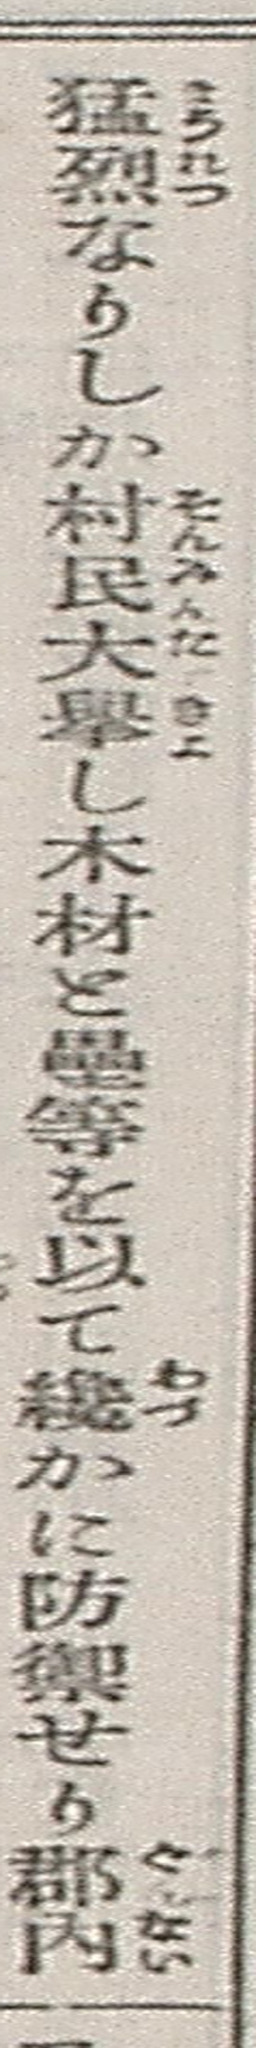猛烈なりしが村民大挙し木材と畳等を以て纔かに防禦せり郡内
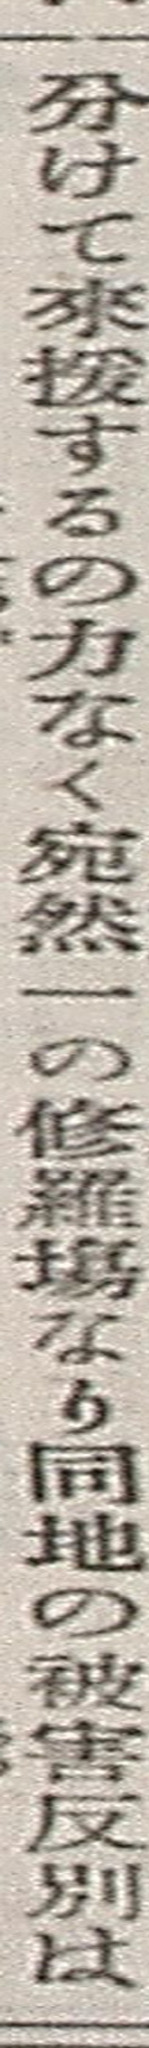分けて來援するの力なく宛然一の修羅場なり同地の被害反別は
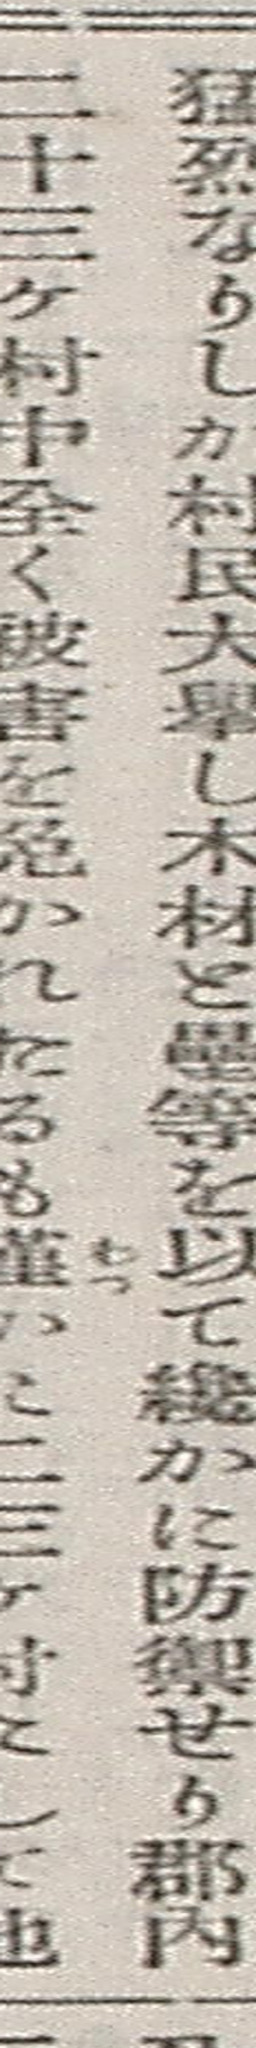二十三ヶ村中全く被害を免かれたるも僅かに二三ヶ村にして他
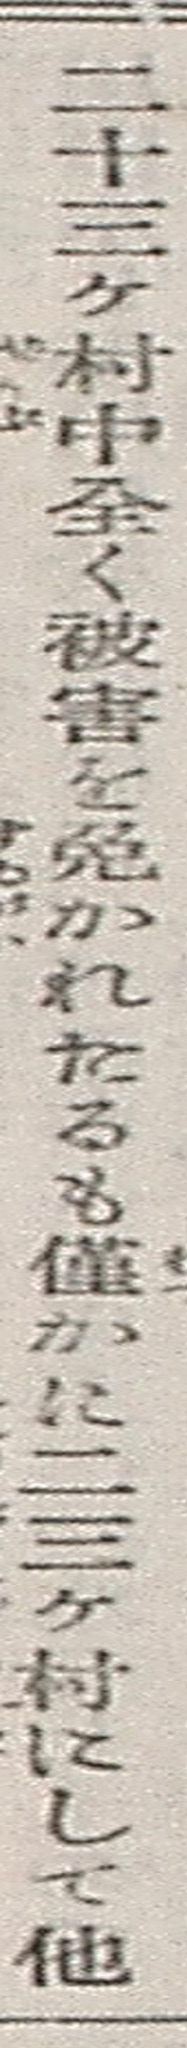二十三ヶ村中全く被害を免かれたるも僅かに二三ヶ村にして他
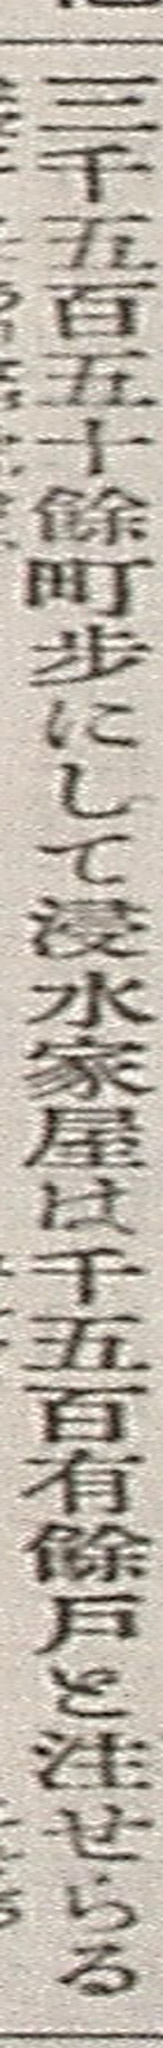三千五百五十餘町歩にして浸水家屋は千五百有餘戸と注せらる
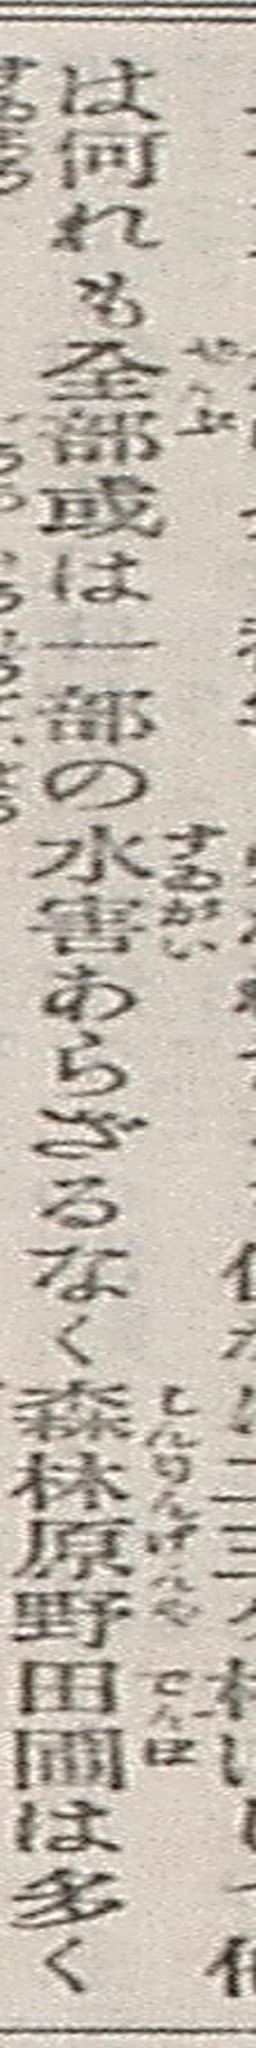は何れも全部或は一部の水害あらざるなく森林原野田圃は多く
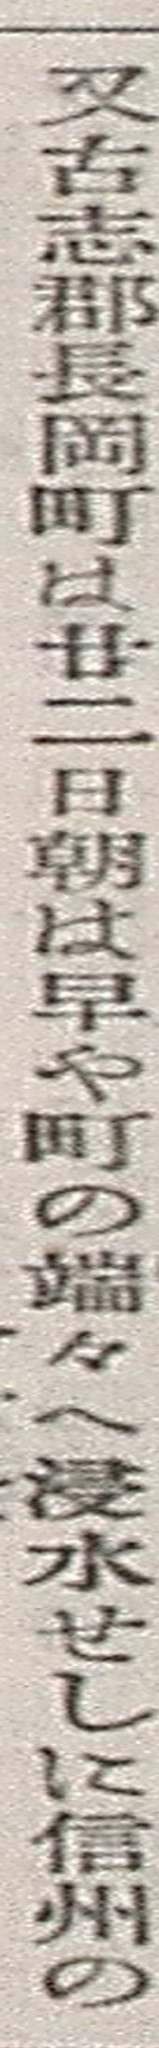又古志郡長岡町は廿二日朝は早や町の端々へ浸水せしに信州の
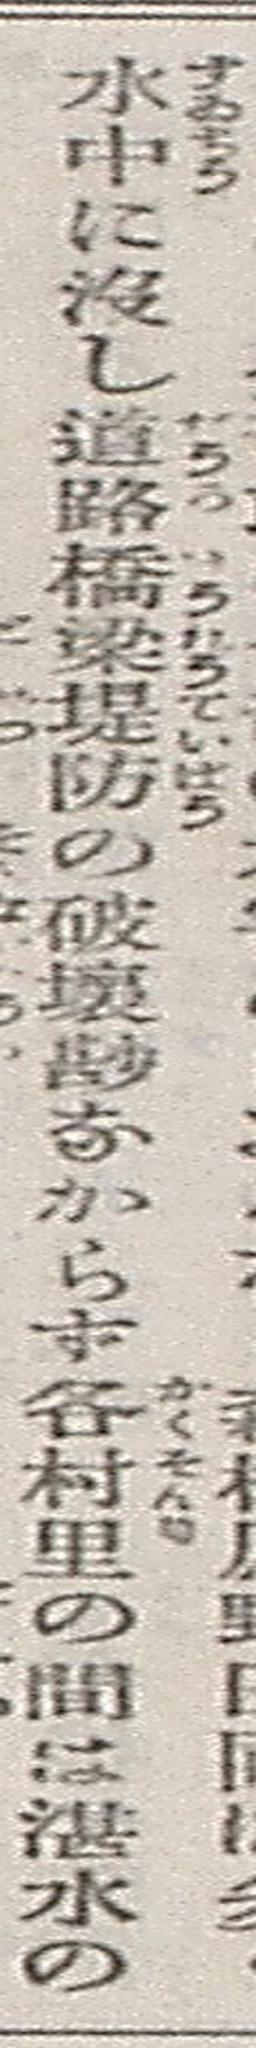水中に没し道路橋梁堤防の破壊尠なからず各村里の間は潜水の
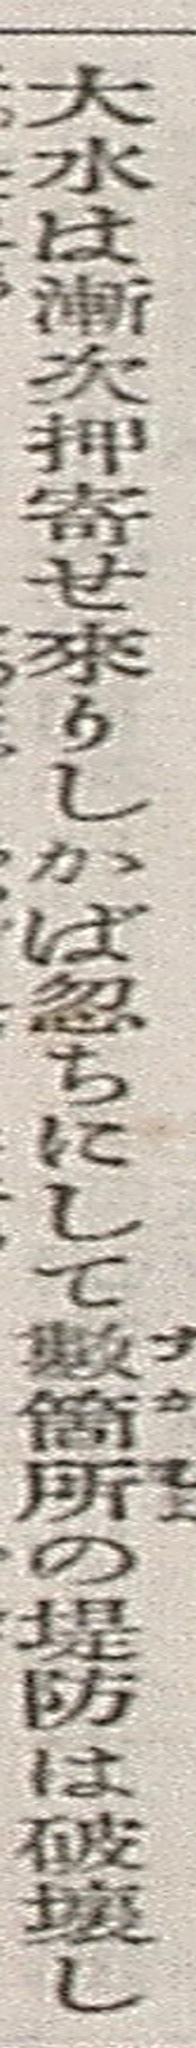大水は漸次押寄せ来りしかば忽ちにして数箇所の堤防は破壊し
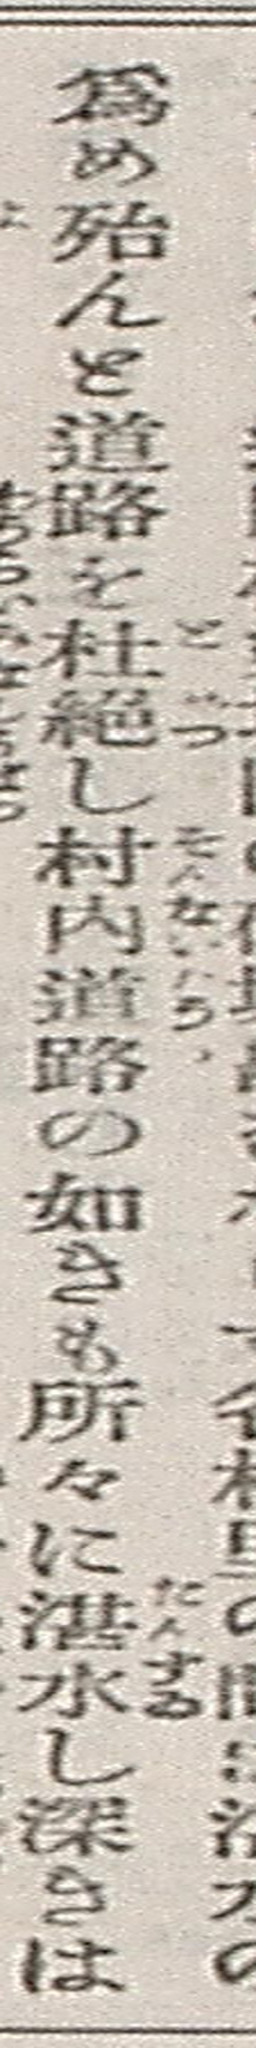為め殆んど道路を杜絶し村内道路の如きも所々に湛水し深きは
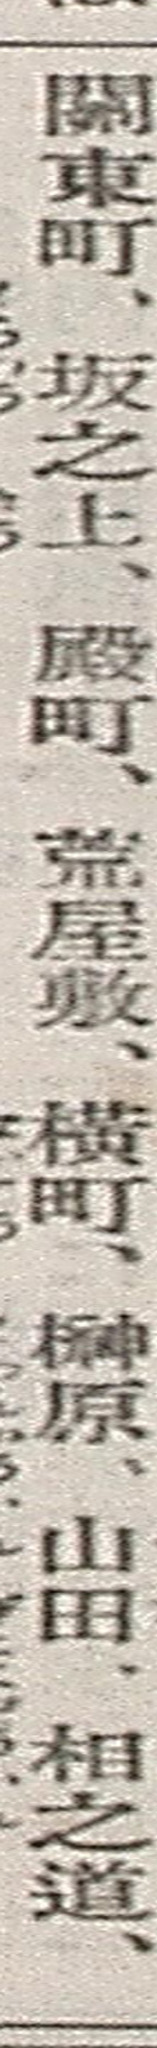関東町、坂の上、殿町、荒屋敷、横町、榊原、山田、相之道、
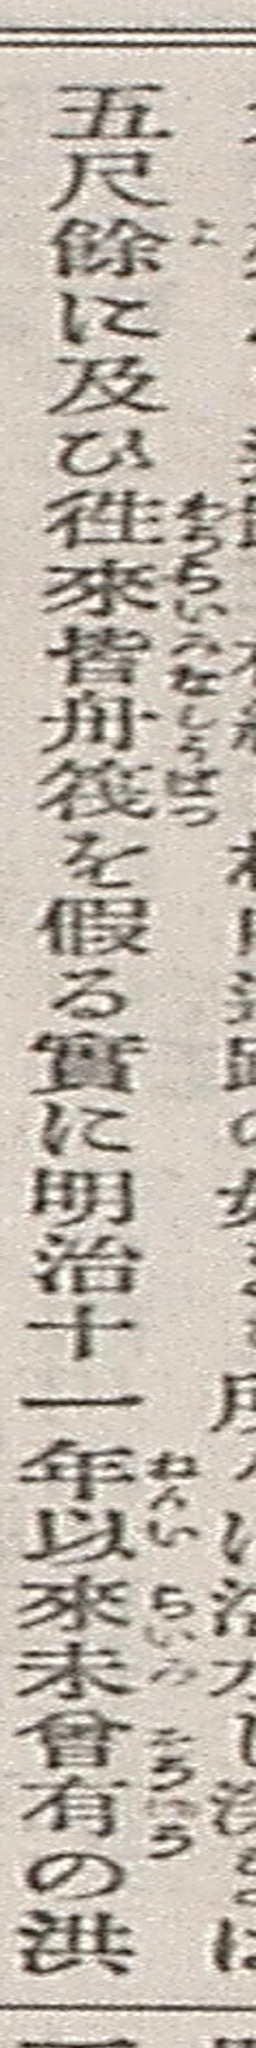五尺餘に及び往来皆舟筏を仮る実に明治十一年以来未曾有の洪
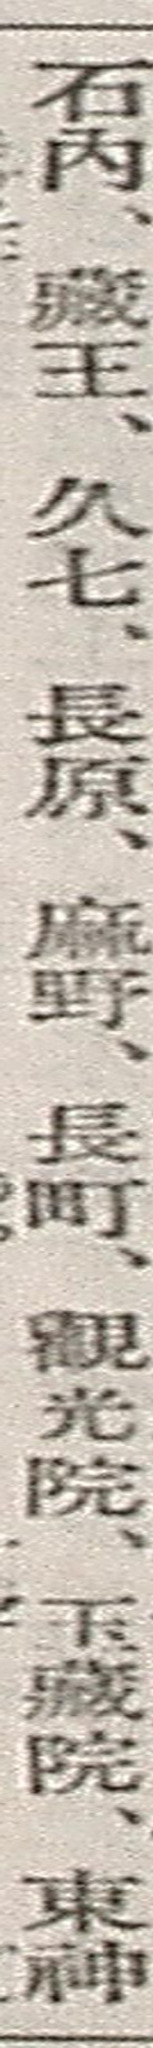石内、蔵王、久七、長原、麻野、長町、観光院、玉蔵院、東神
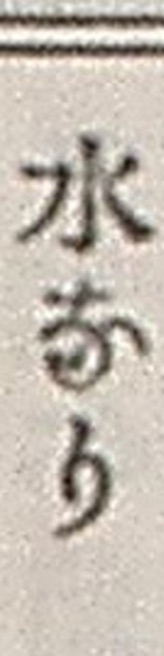水なり
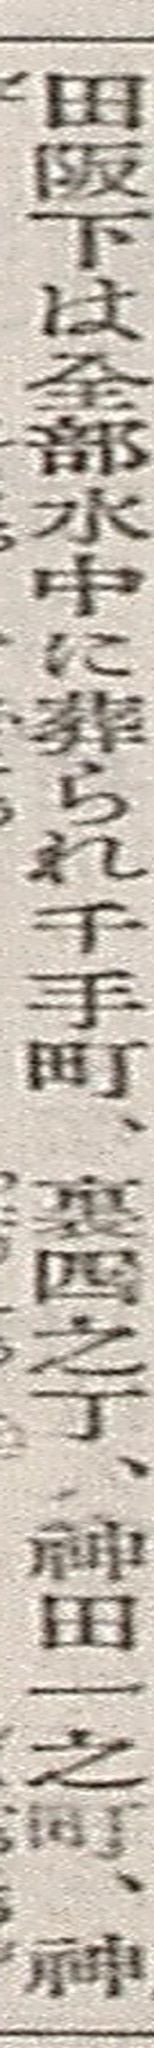田坂下は全部水中に葬られ千手町、裏四之丁、神田一之町、神
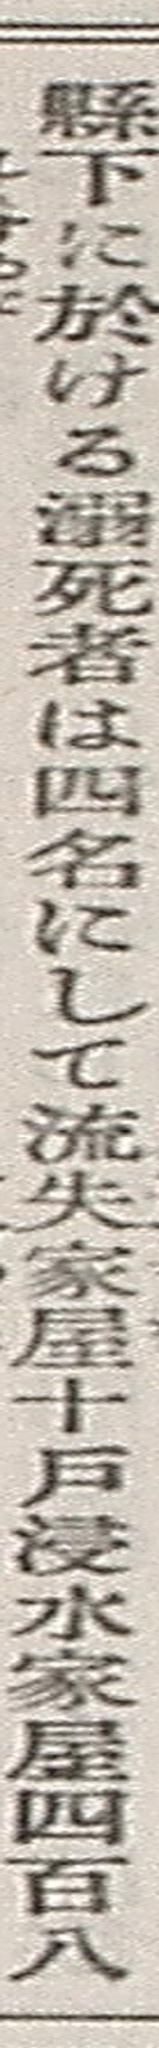県下に於ける溺死者は四名にして流失家屋十戸浸水家屋四百八
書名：風俗畫報臨時増刊第百二十八號　洪水被害録（下）
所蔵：東京大学地震研究所図書室 Earthquake Research Institute Library, The University of Tokyo, JAPAN
